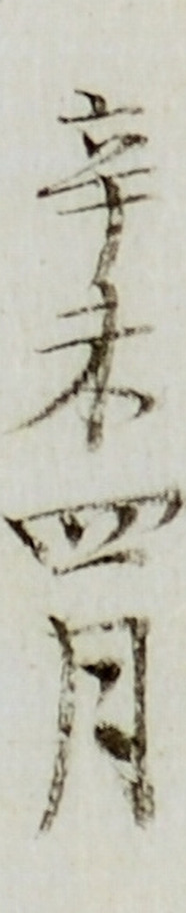辛未四月
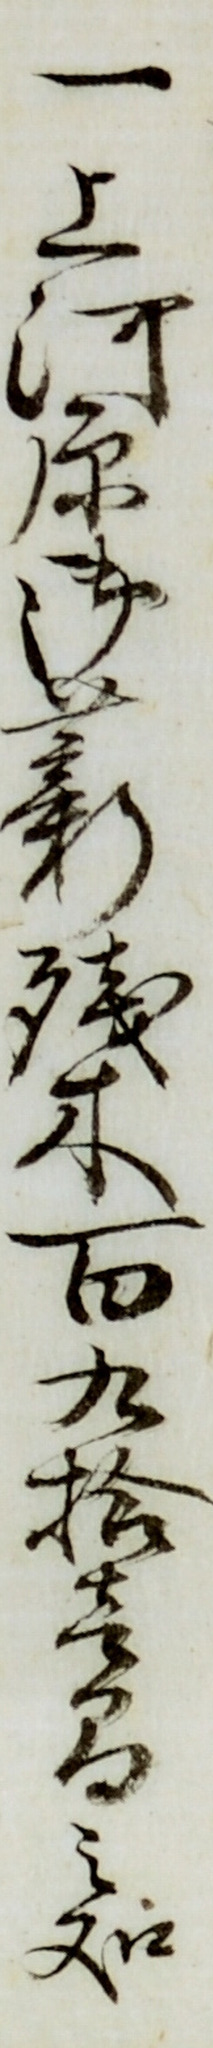一上河原御薪残木百九拾壱間之処
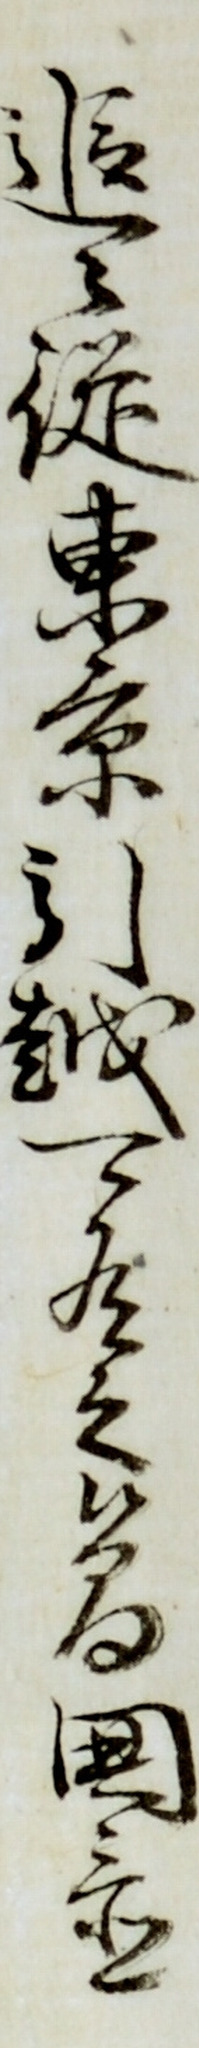追々従東京引越可有之候間囲置

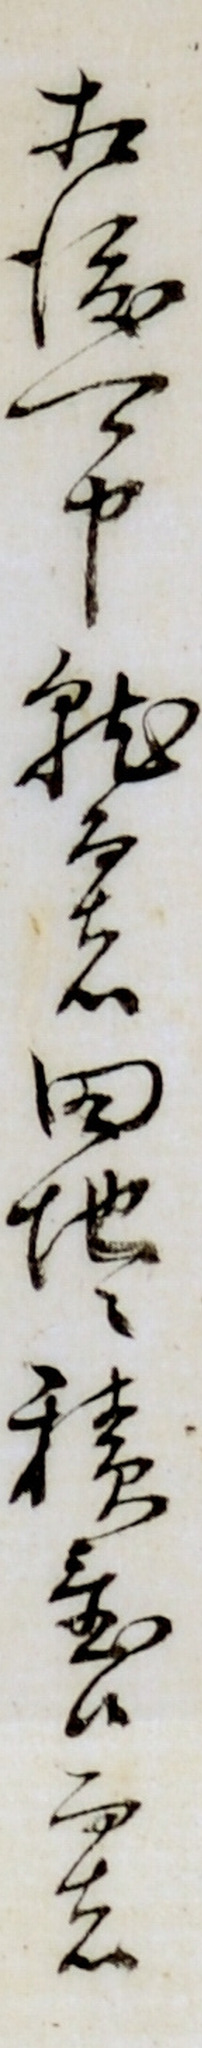相渡可申就ては田地に積置候ては
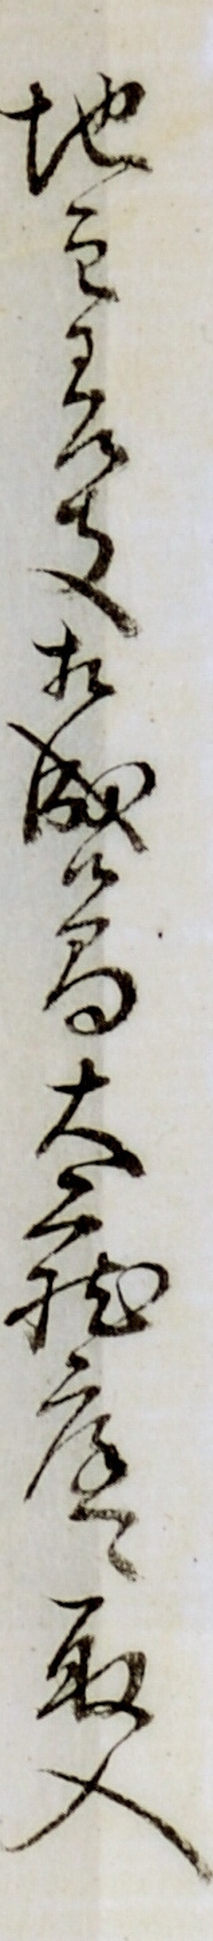地主差支相成候間大蔵庭へ取入
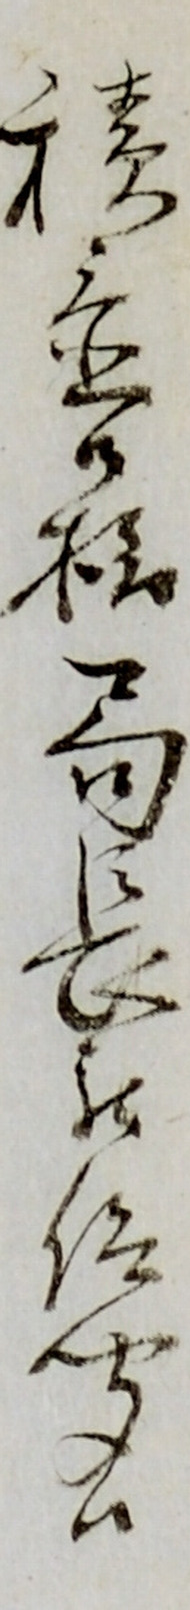積置候様局長被仰聞候
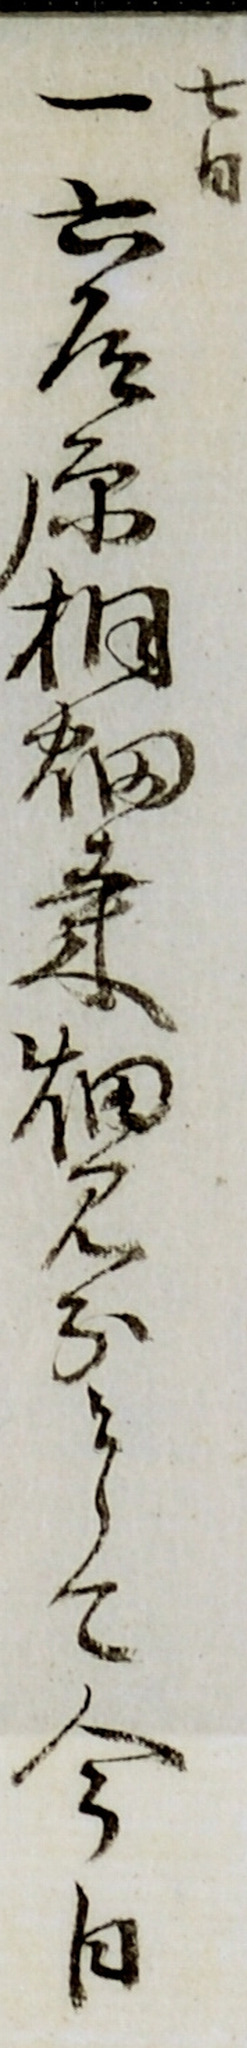一六道原桐畑桑畑見分として今日
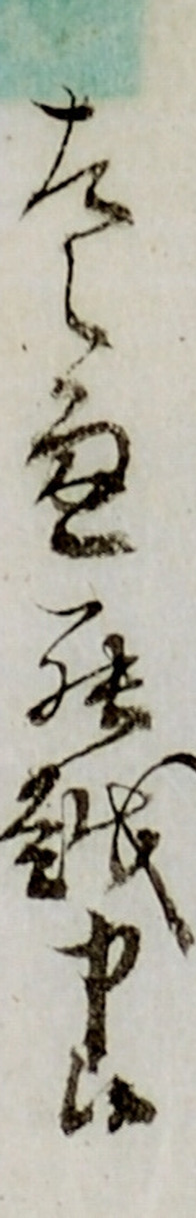左之通罷越申候
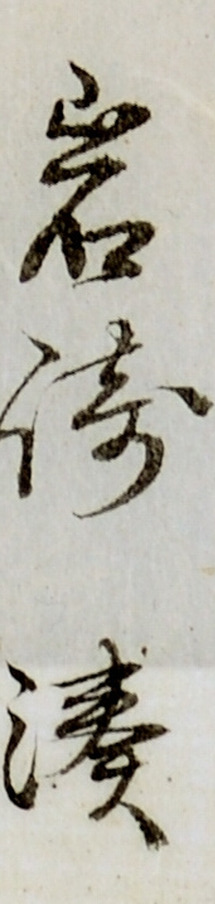岩崎湊
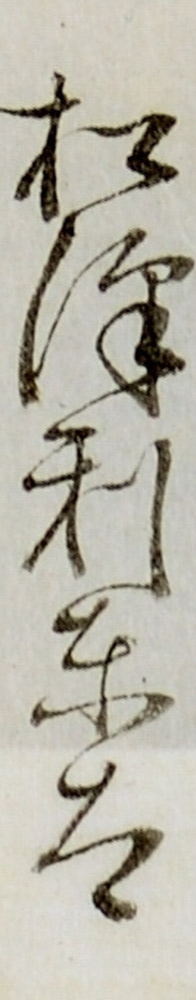松沢利東太
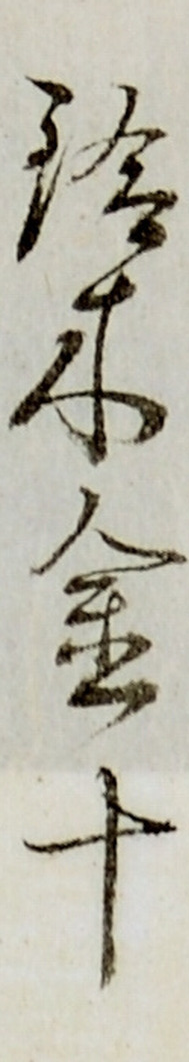鈴木金十
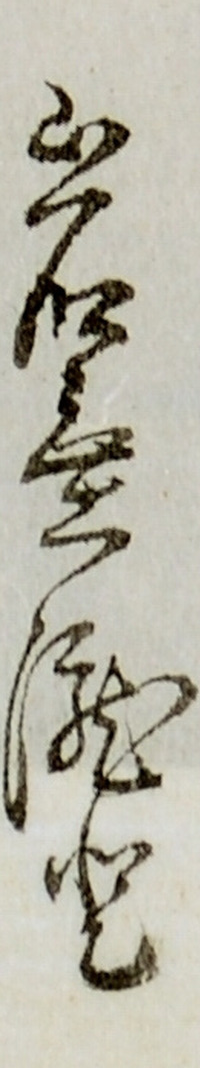岩垂滝登
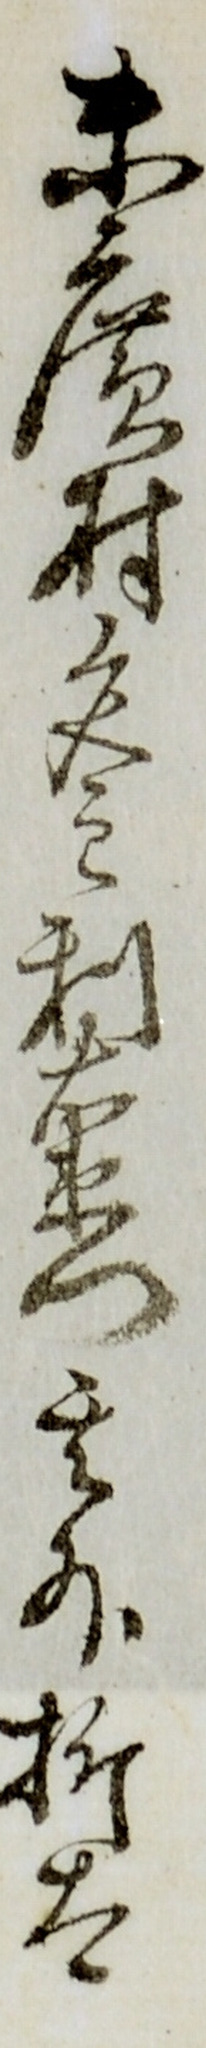末広村名主利右衛門其外折太
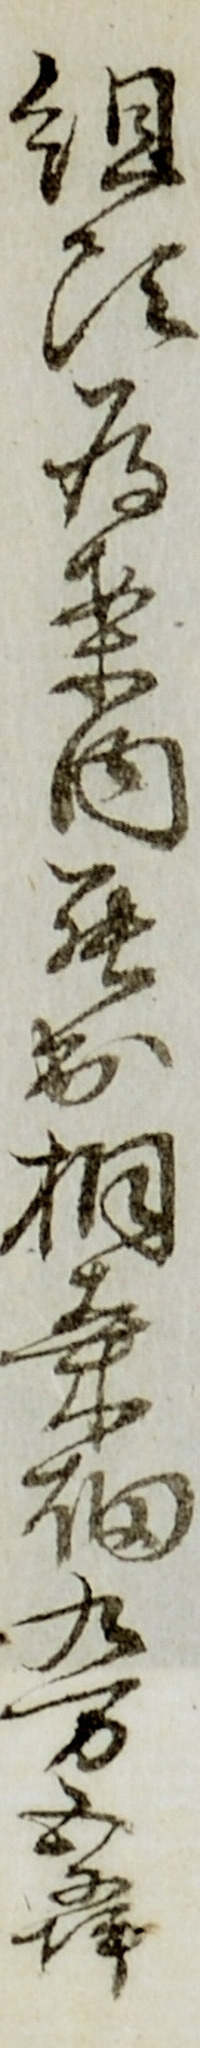組頭為案内罷出桐桑畑九万五千坪
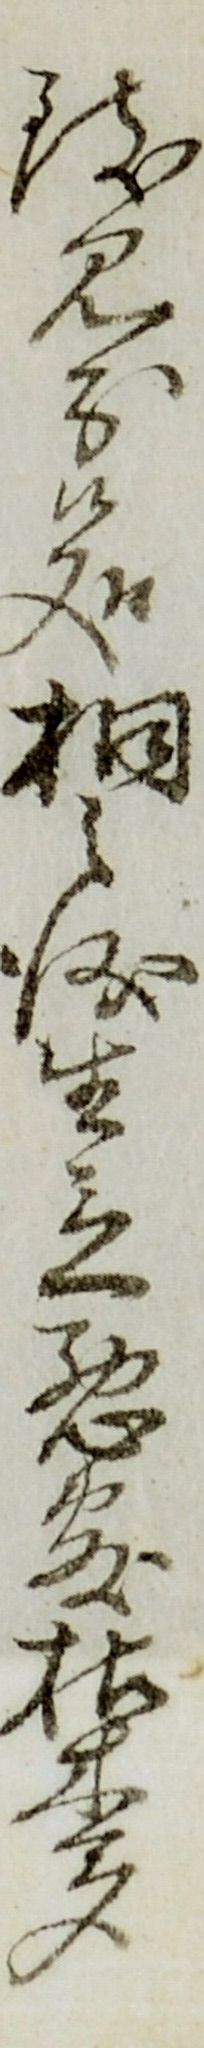致見分候処桐之儀生立悪敷枯木多
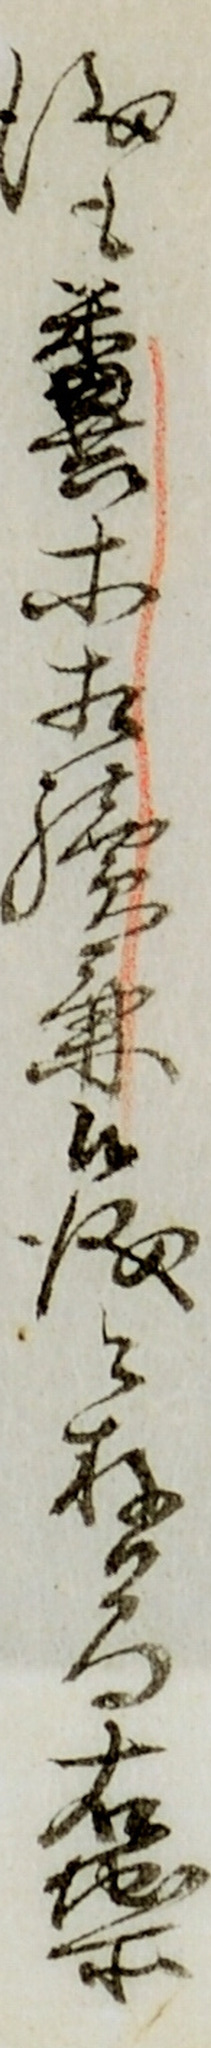儀も糞木相続兼候儀と存候間右地所
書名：山林方諸事御用留
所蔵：伊那市立高遠町図書館・合同会社AMANE
